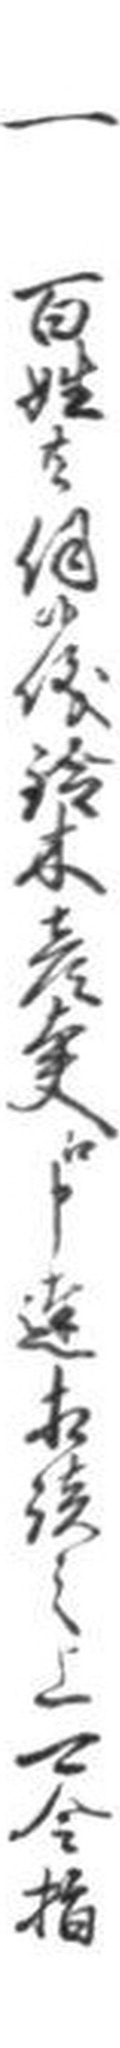一百姓共伺候儀鈴木彦太夫江申達之相談之上可冷指
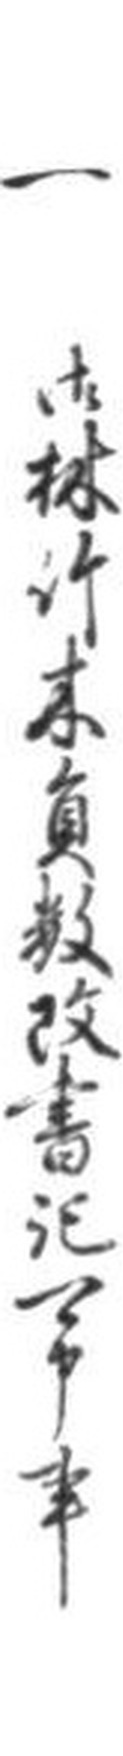一御林竹木員数改書記可申事
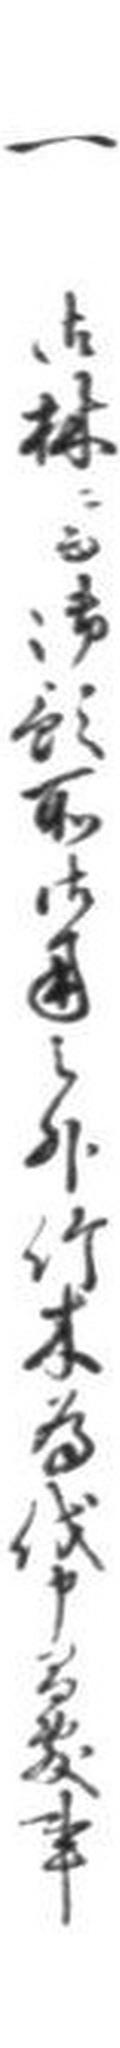一御林ニ而御領所御用之外竹木為伐申間敷事
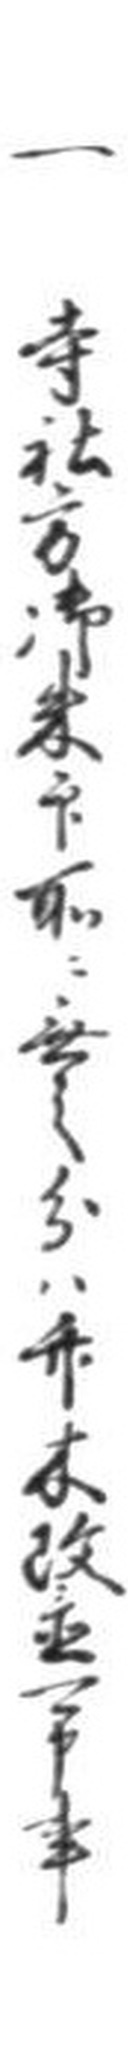一寺社方御朱印所ニ無之分ハ竹木改置可申事
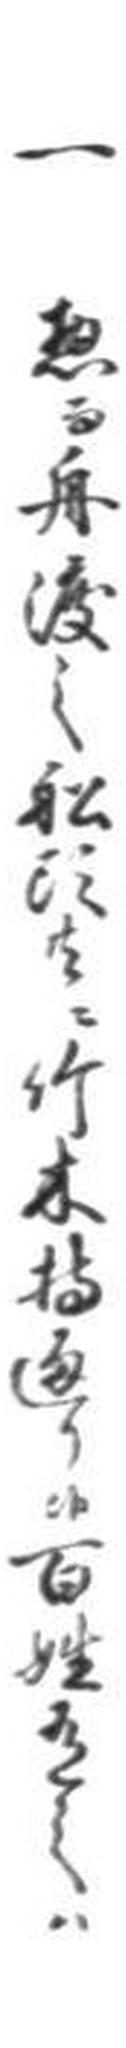一惣而舟渡之船頭共ニ竹木持帰り候百姓有之ハ
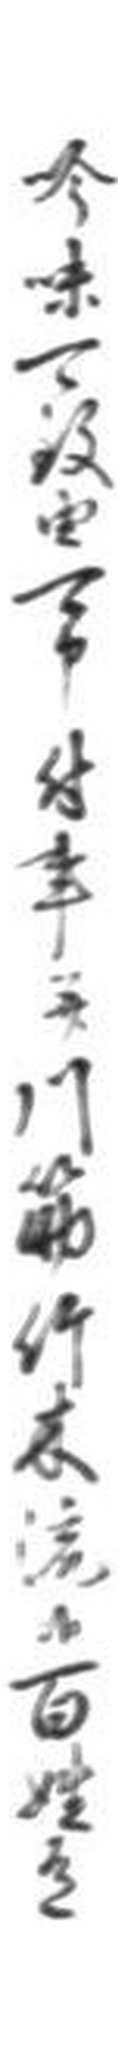吟味可致由可申付事幷川筋竹木流候百姓有
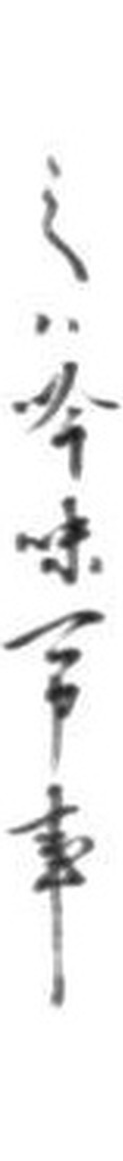之ハ吟味可申事
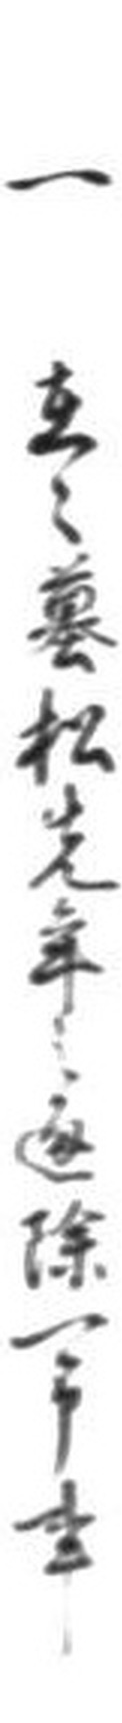一在々墓松先年之通除可申事
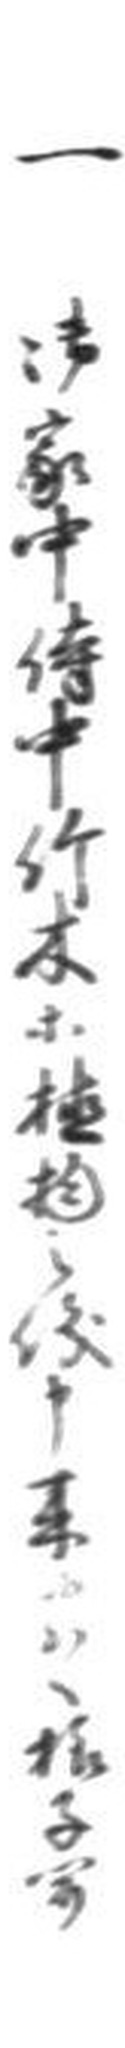一御家中侍中竹木等植物之儀申来候ハヽ様子聞
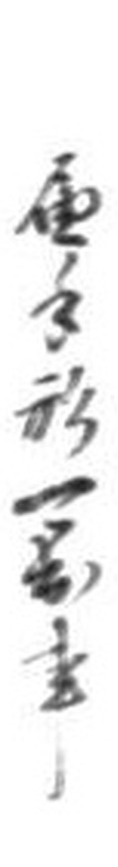届手形可出事
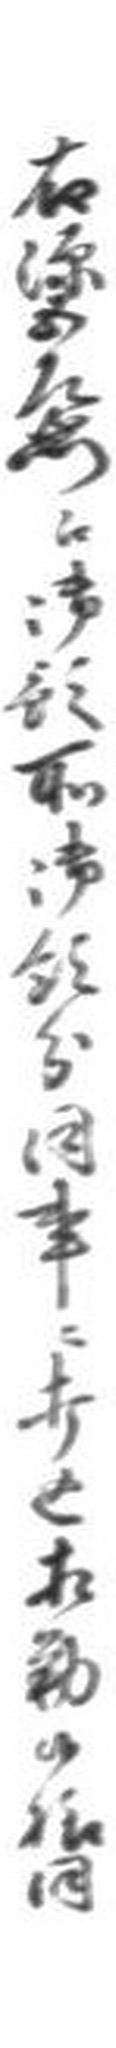右源吾左衛門江御領所御領分同事ニ打込相勤候様同
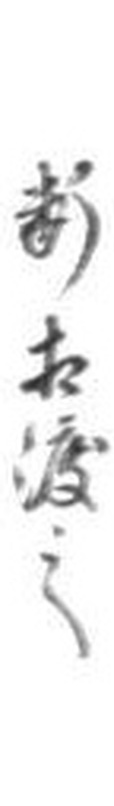断相渡之
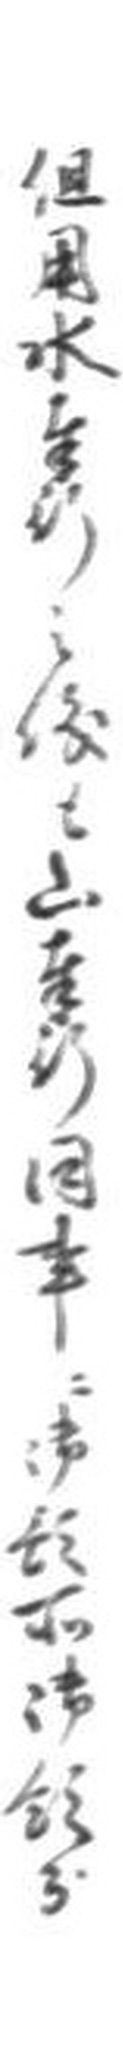但用水奉行之儀も山奉行同事ニ御領所御領分

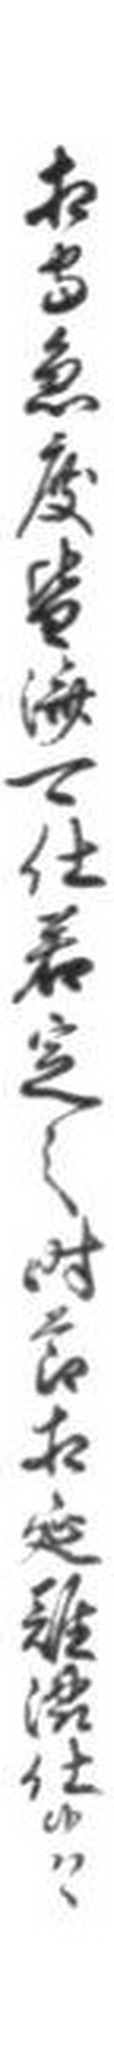相守急度替済可仕若定之時節相定難渋仕候ハヽ
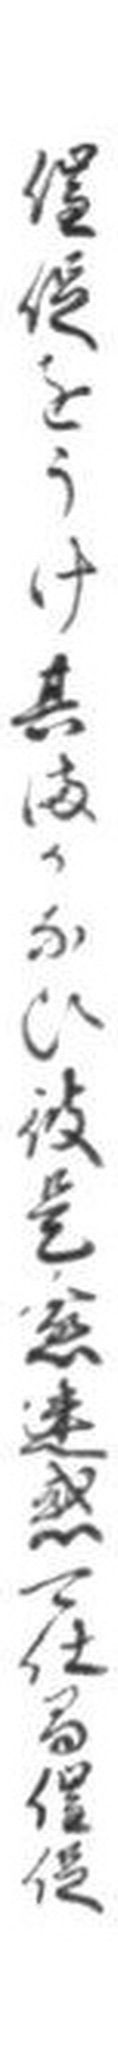催促をうけ其まかなひ彼是愈迷惑可仕間催促
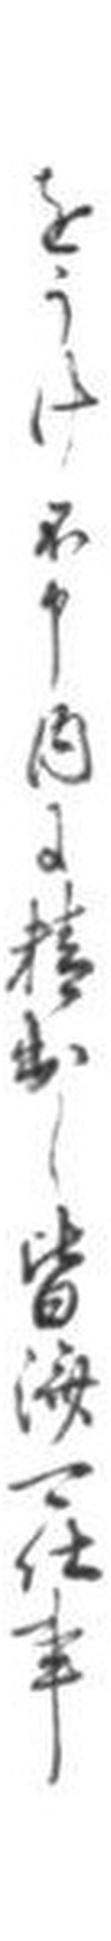をうけ不申内に精出し皆済可仕事
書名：家譜 三十四 吉邦公 従享保五年到同六年
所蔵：福井県文書館 Fukui Prefectural Archives
